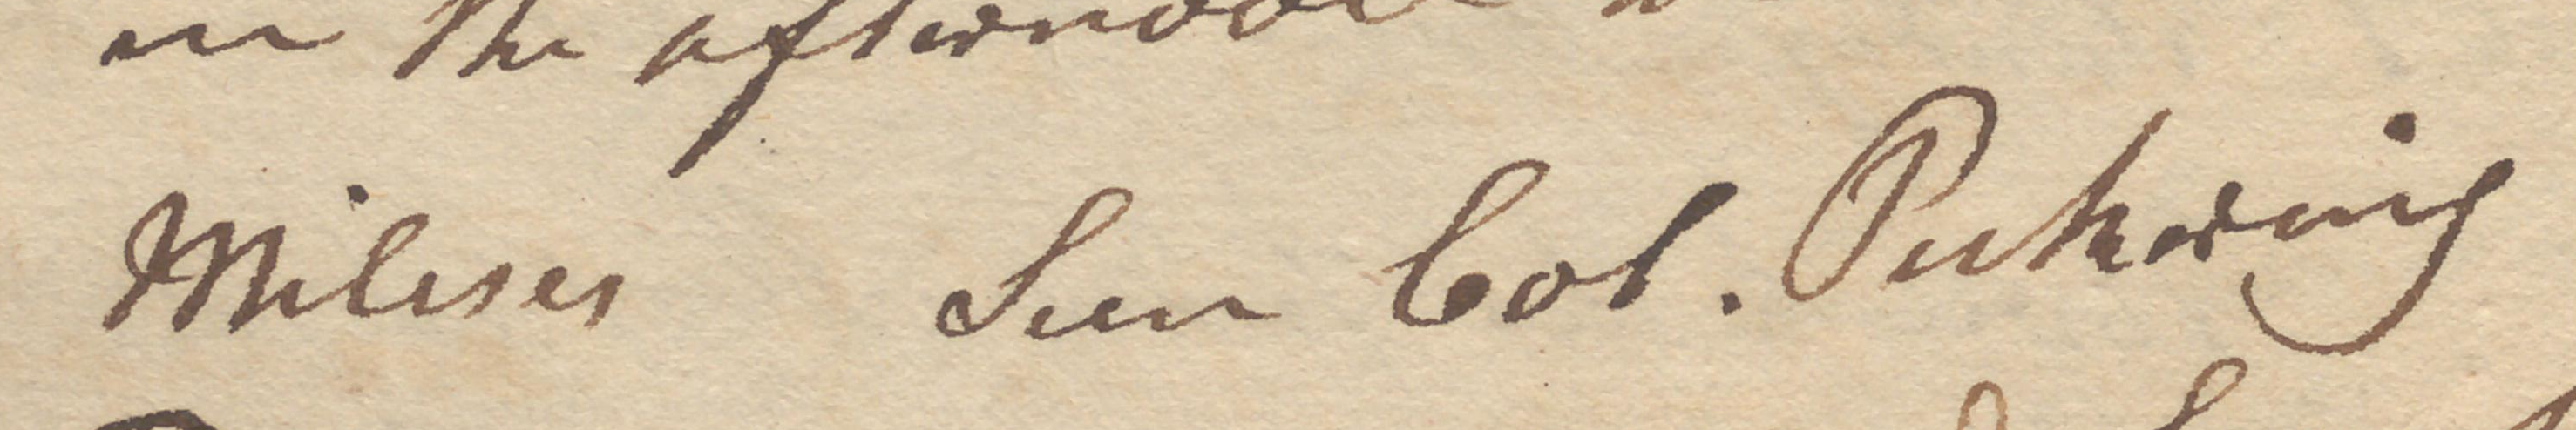Mileses seen Col. Pikering
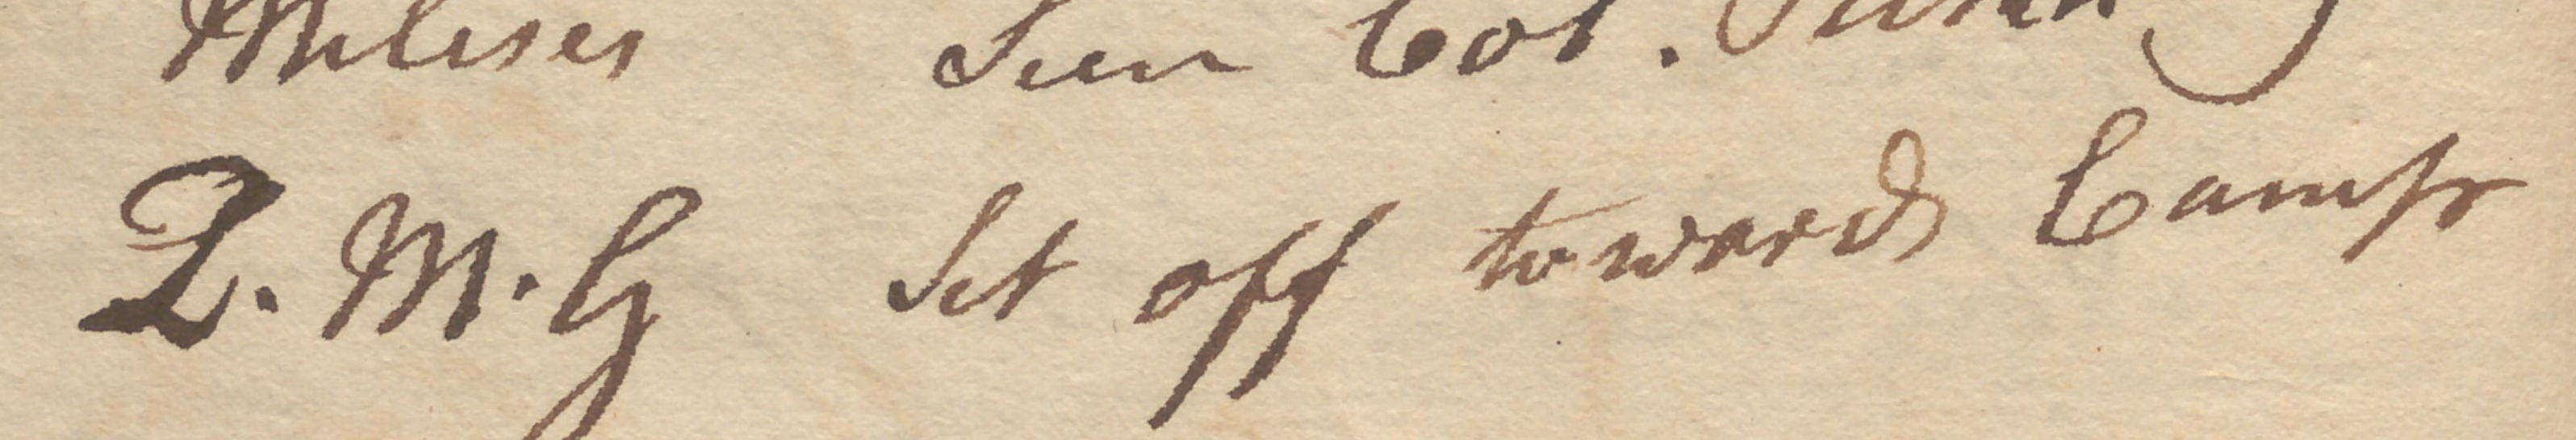Q. M.G Set off towards Camp
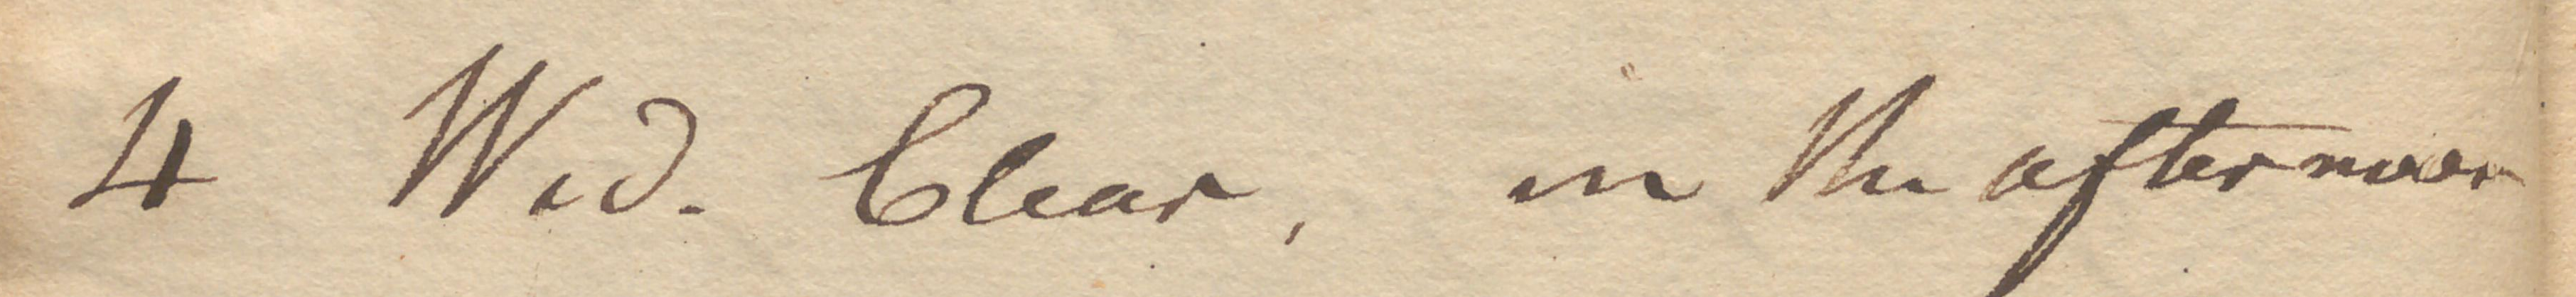4 Wed. Clear in the afternoon
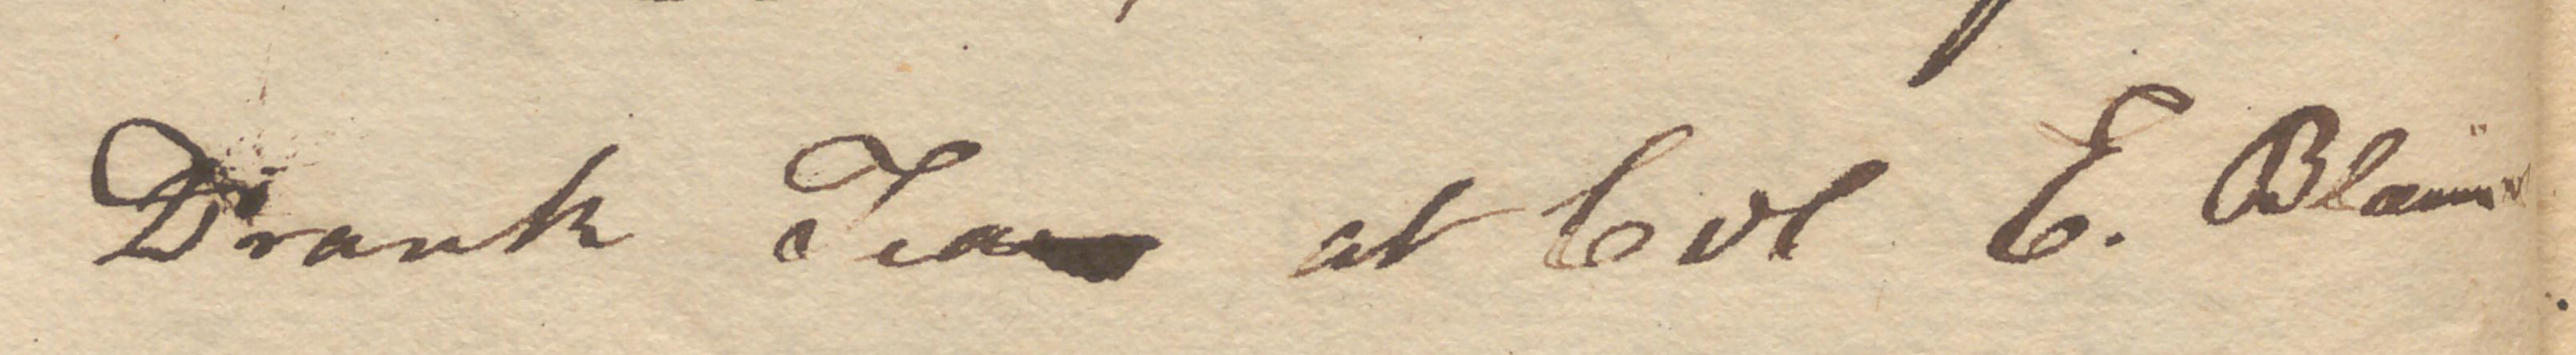Drank Teae at Col E. Blamn
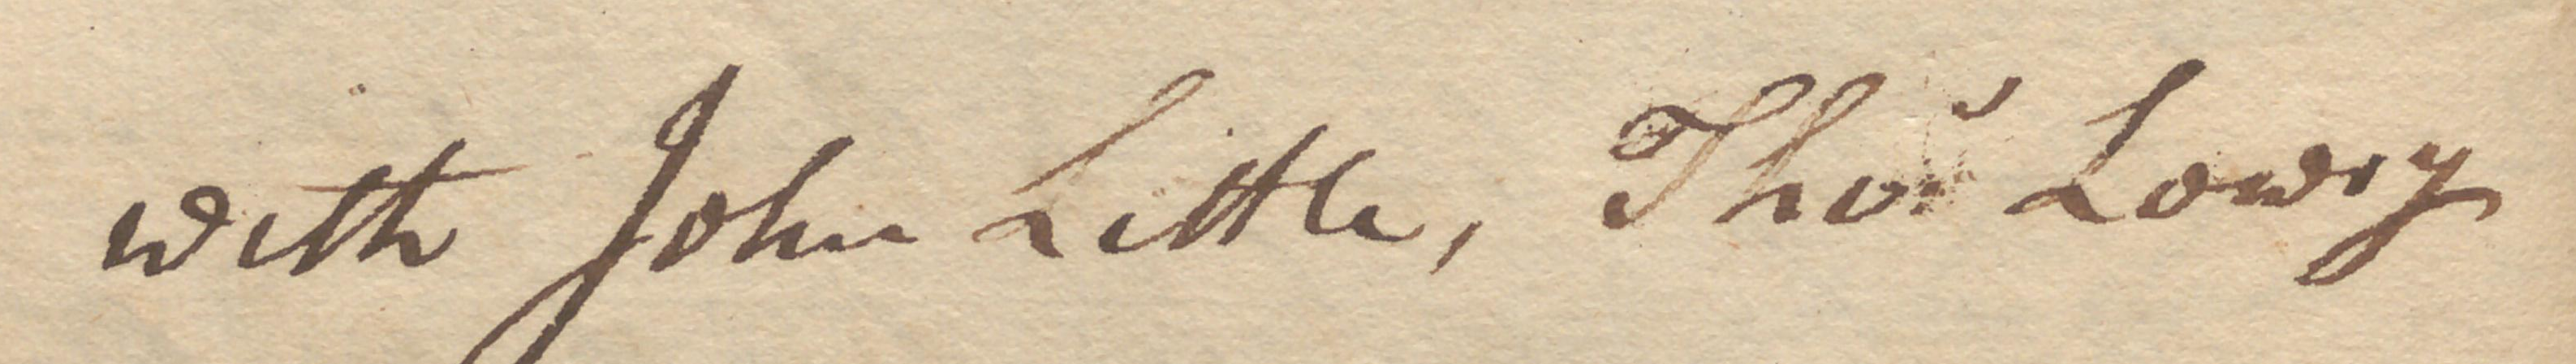with John Little, Tho^s Lowry
